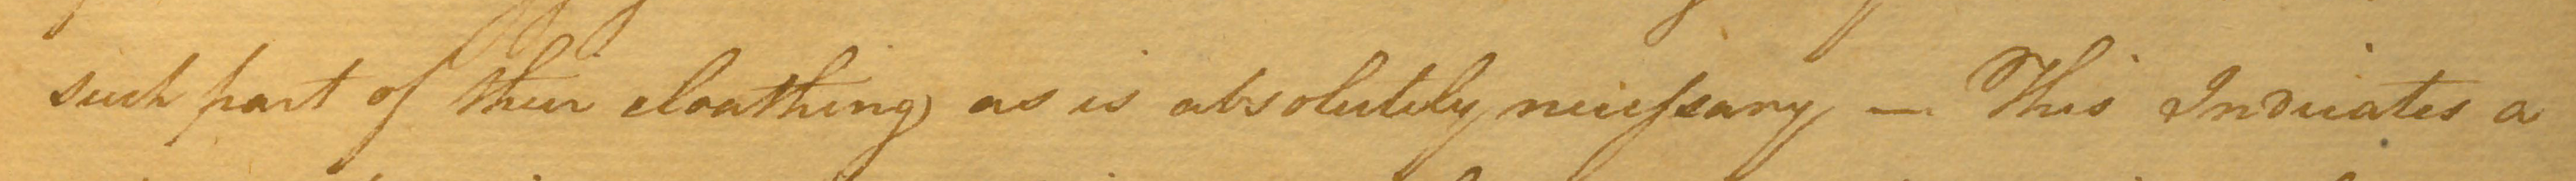such part of their cloathing as is absolutely necessary- This Indicates a
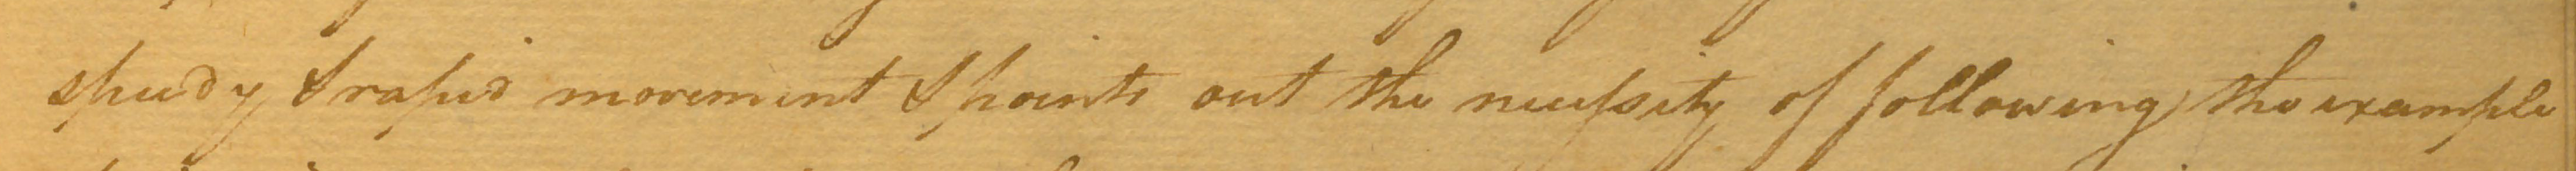speedy & rapid movement & points out the necessity of following the example
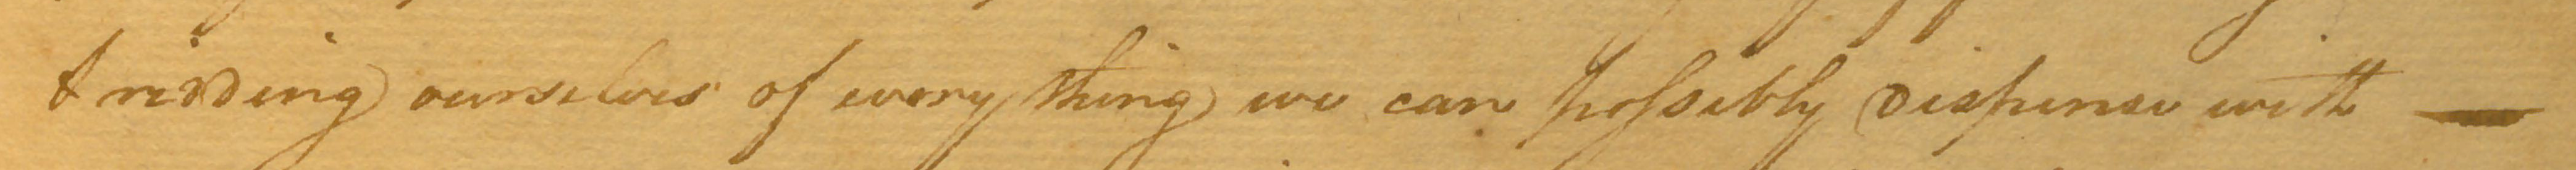& ridding ourselves of every thing we can possibly dispense with-
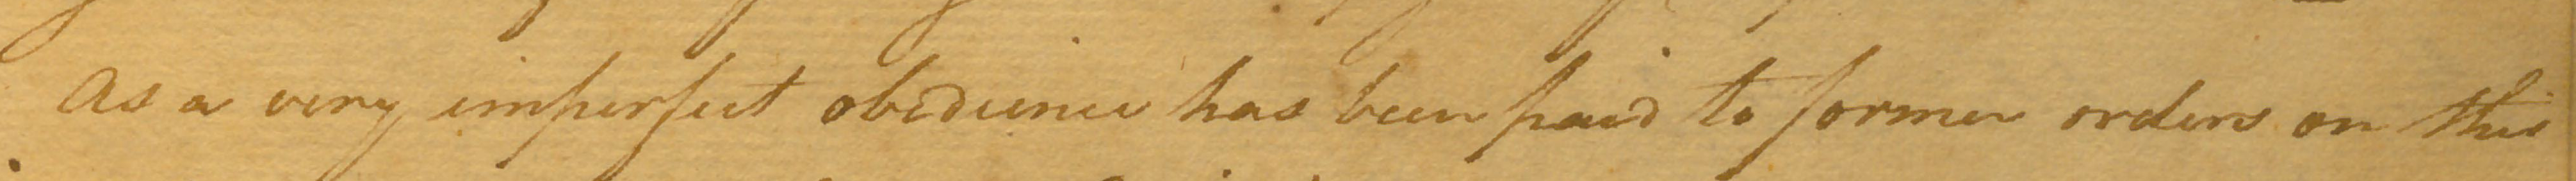As a very imperfect obedience has been paid to former orders on this
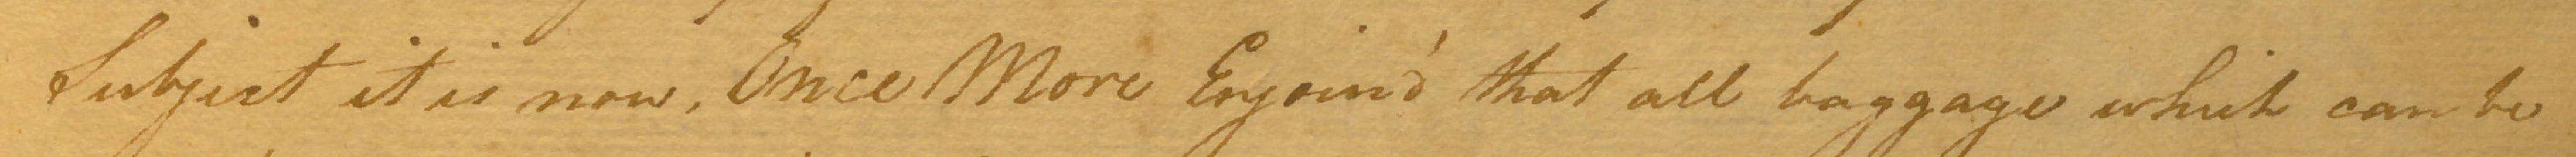Subject it is now, Once More Enjoin'd that all baggage which can be
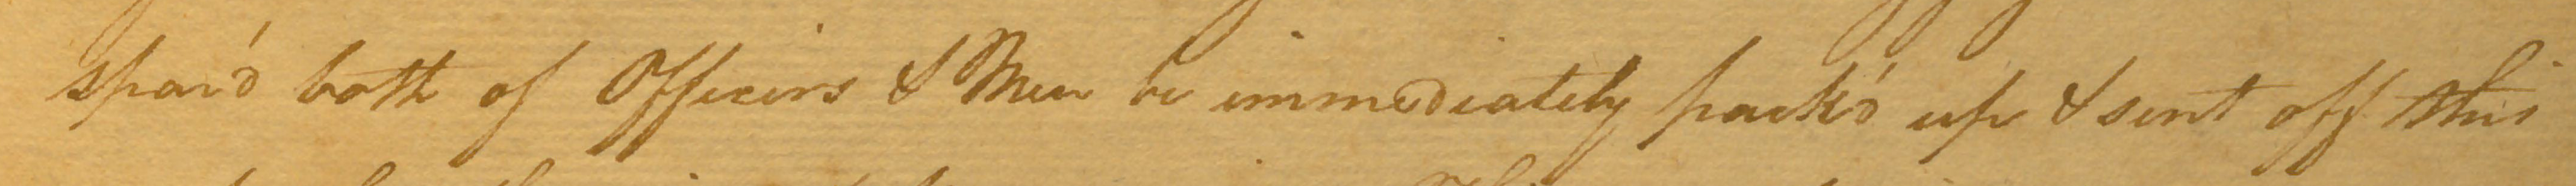spar'd both of Officers & men be immediately pack'd up & sent off this
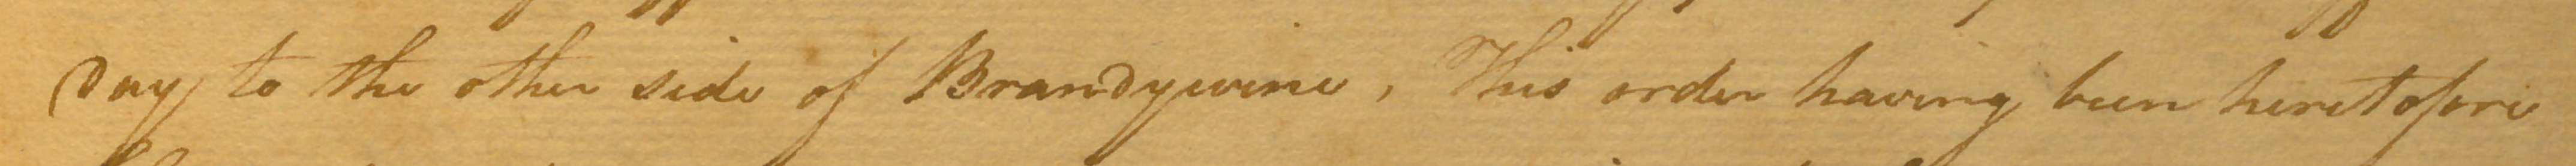day, to the other side of Brandywine, This order having been heretofore
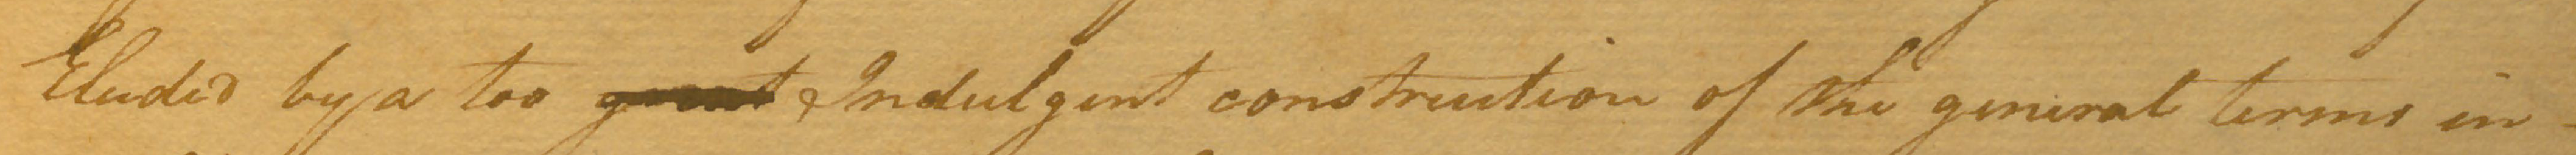Eluded by a too [_____] Indulgent construction of the general terms in
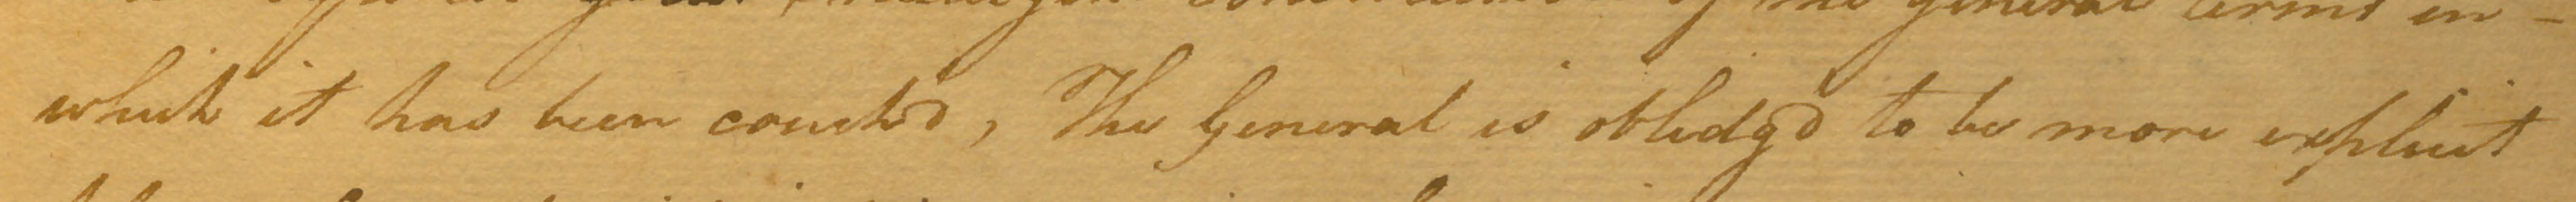which it has been couch'd, The General is oblidgd to be more explicit
